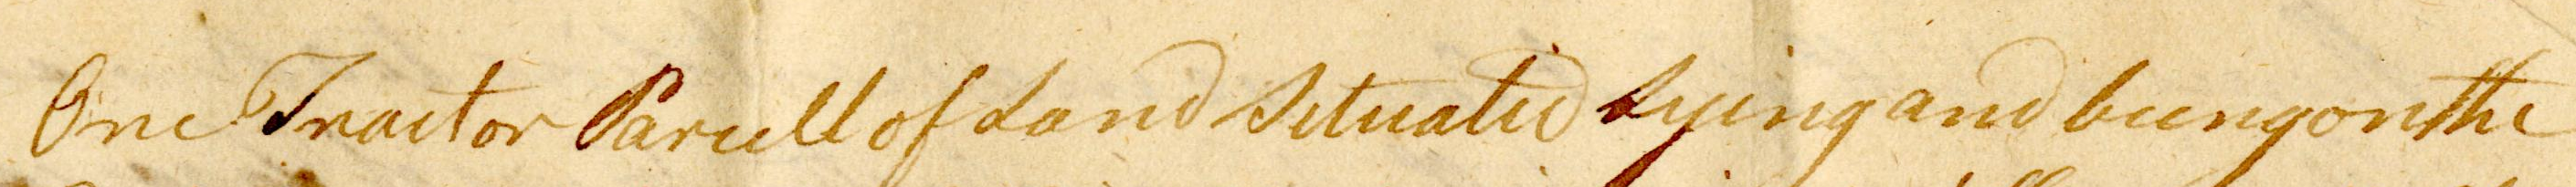One Tract or Parcell of Land situated Lying and being on the
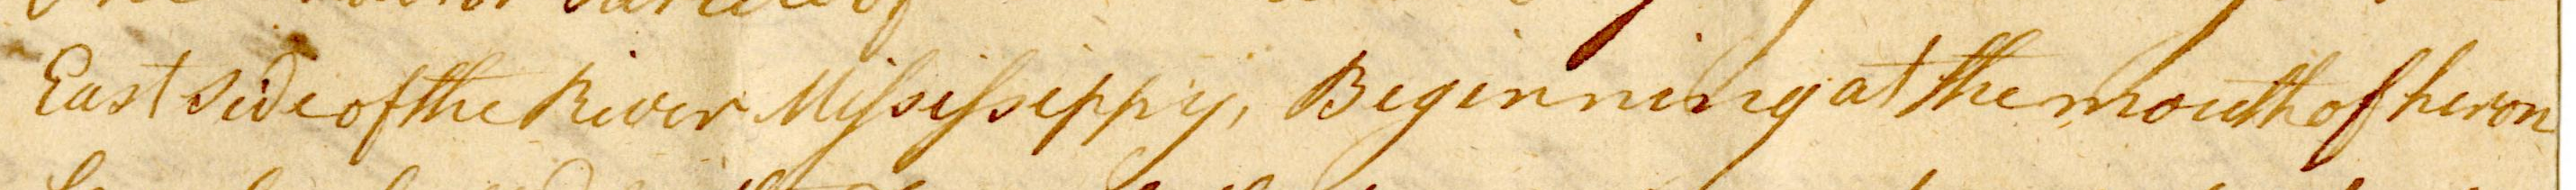East side of the River Mississippy, Beginning at the mouth of heron
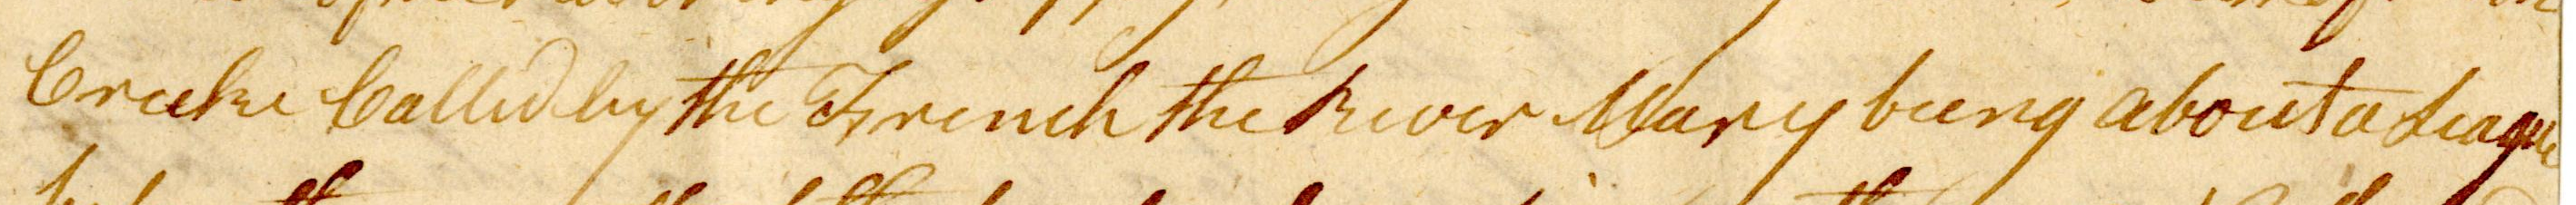Creek Called by the French the River Mary being about a League
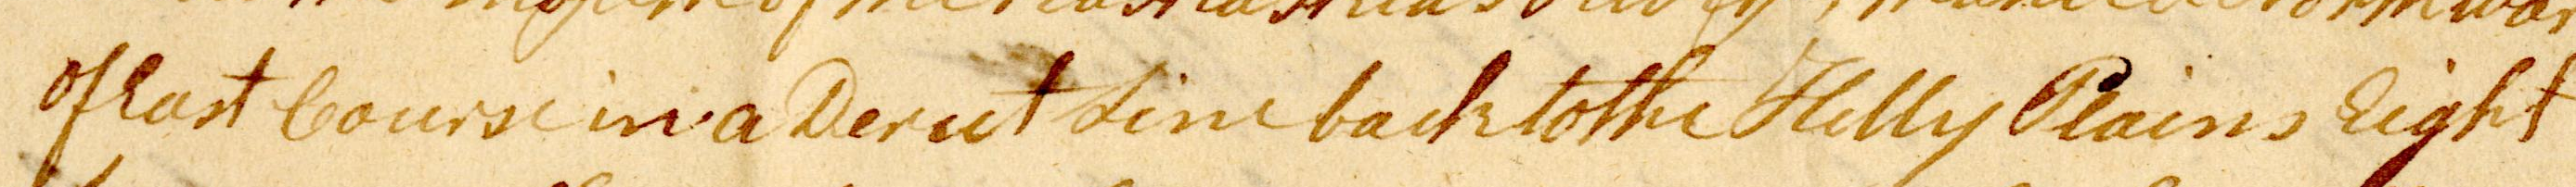of East Course in a Derect Line back to the Hilly Plains Eight
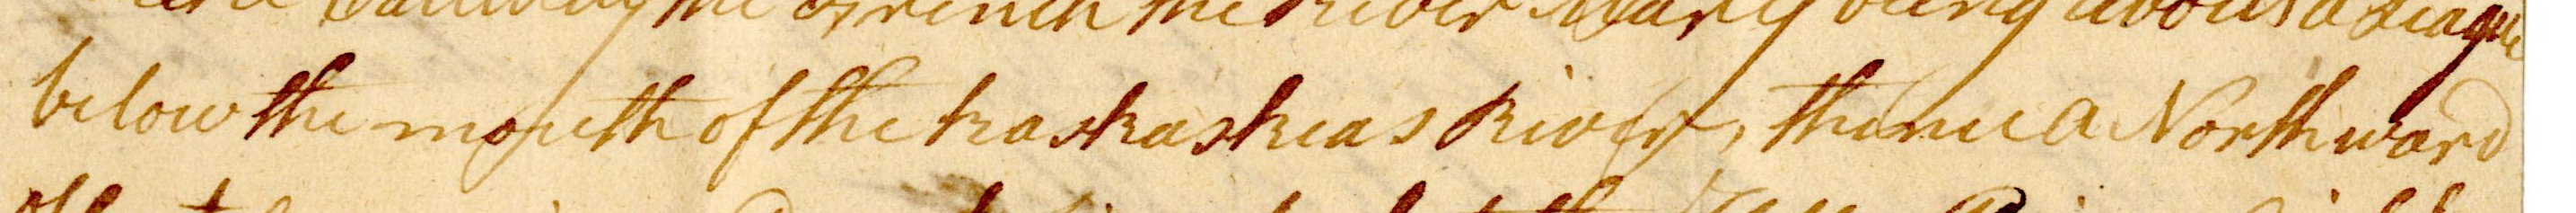below the mouth of the Kaskaskeas River, thence a Northward
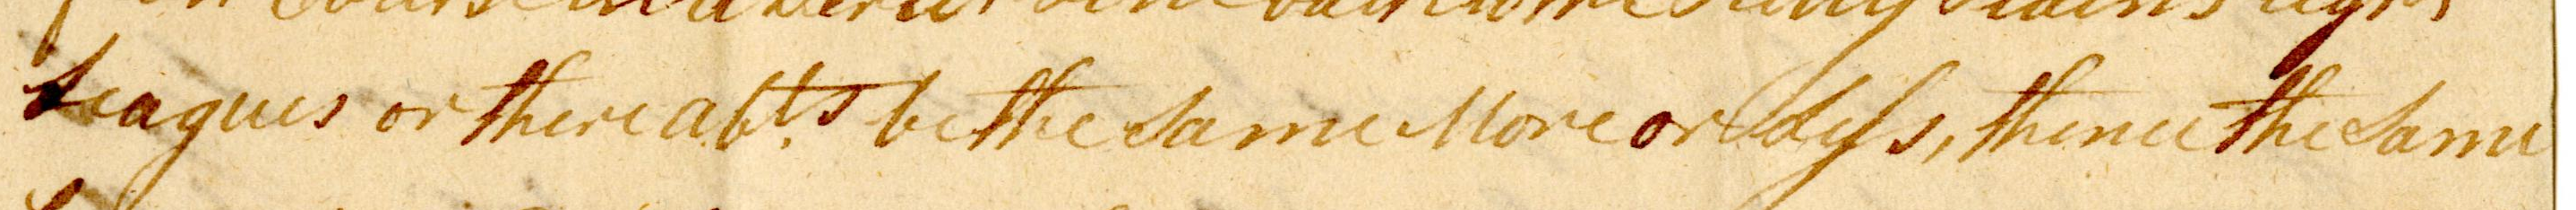Leagues or thereabouts be the same More or less, thence the same
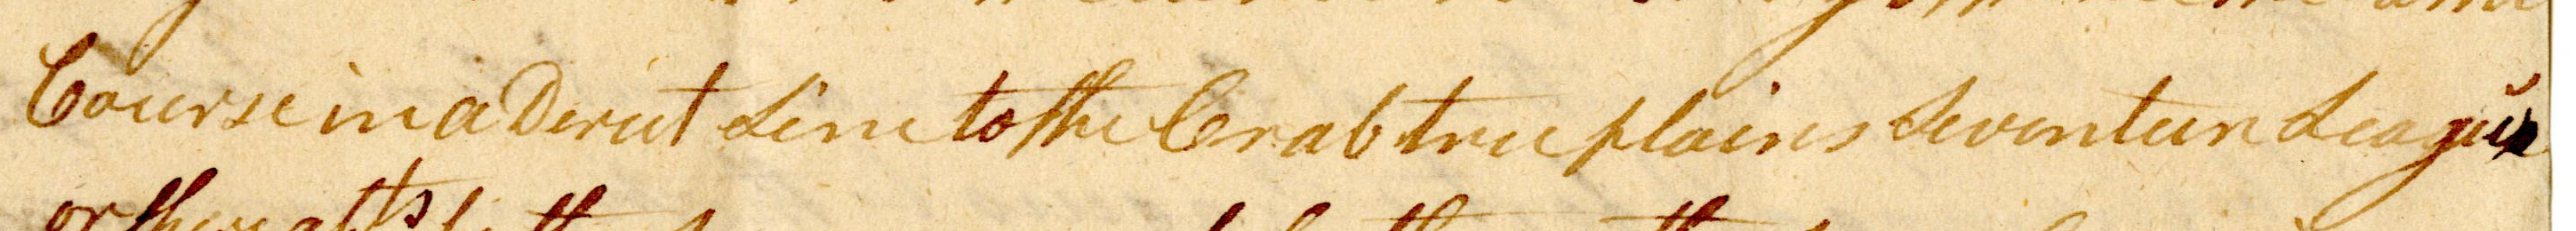Course in a Derect Line to the Crabtree plains Seventeen Leagues
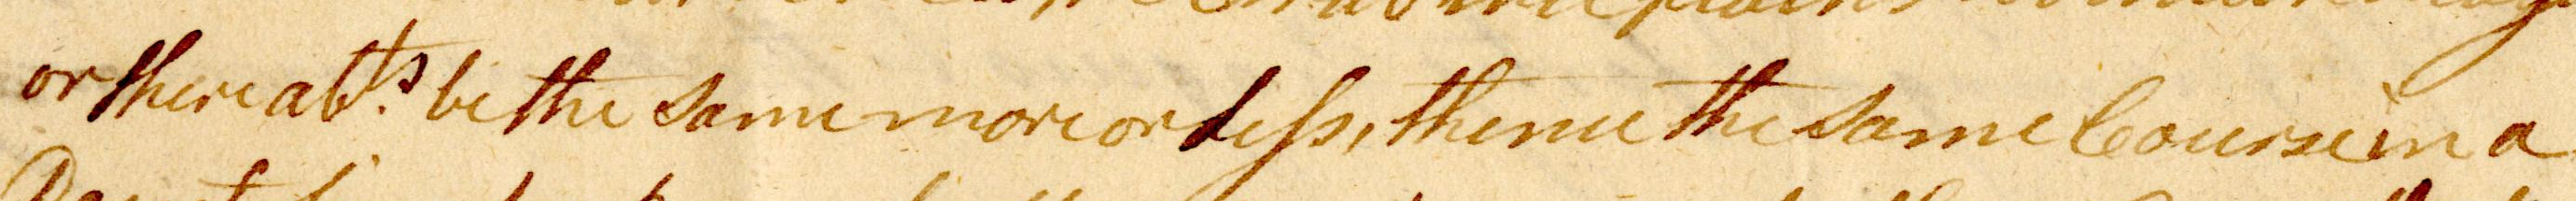or thereab^ts. be the same more or less, there the same Course in a
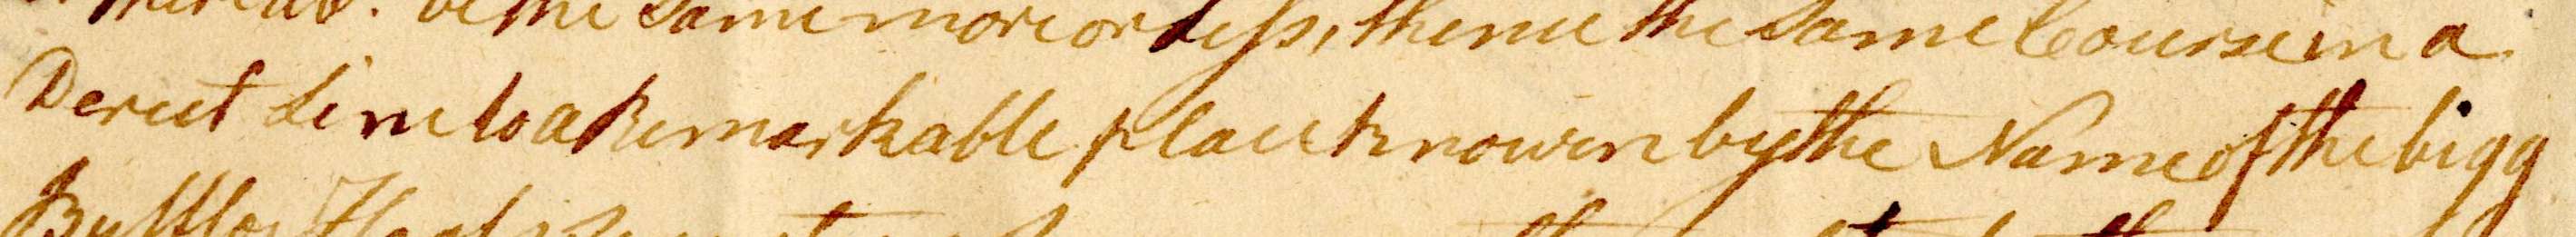Derect Line to a Remarkable place known by the Name of the bigg
